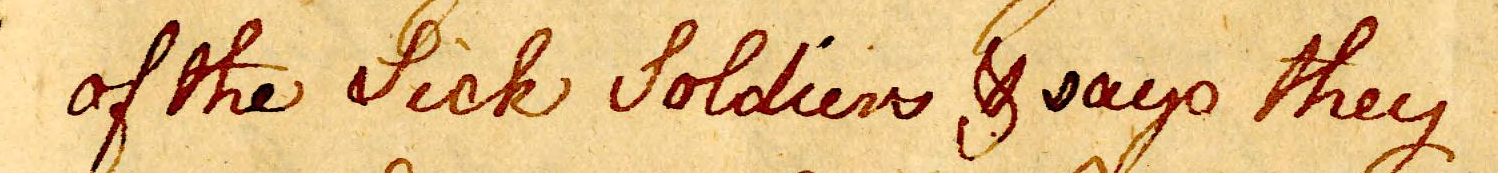of the Sick Soldiers & says they
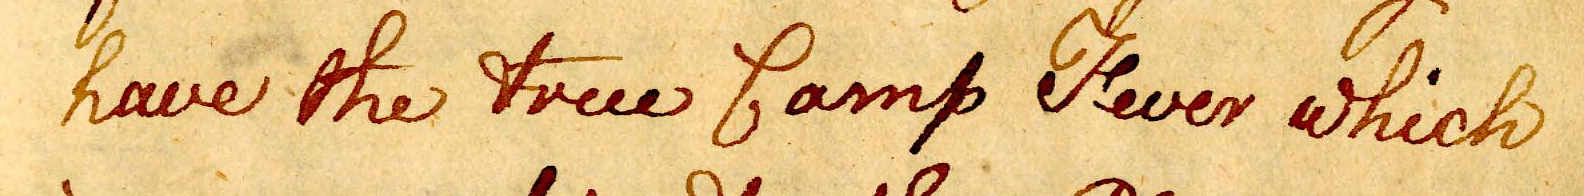have the true Camp Fever which
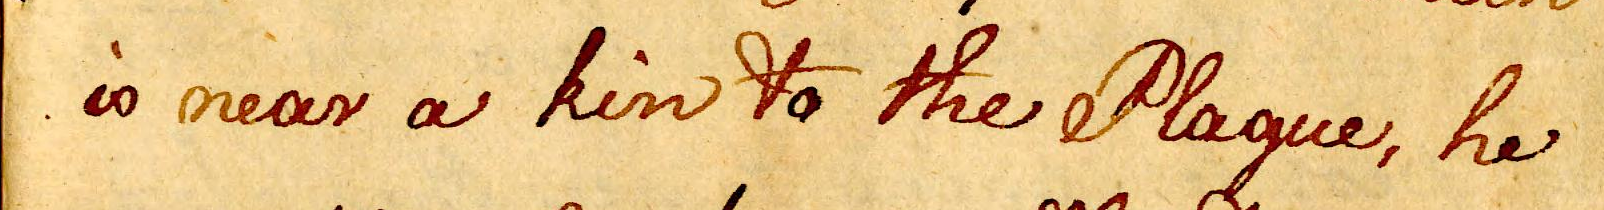is near a kin to the Plague, he
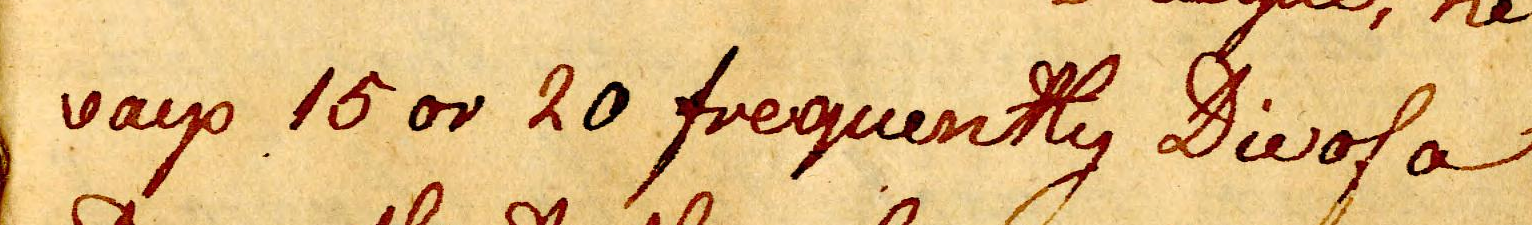says 15 or 20 frequently Die of a
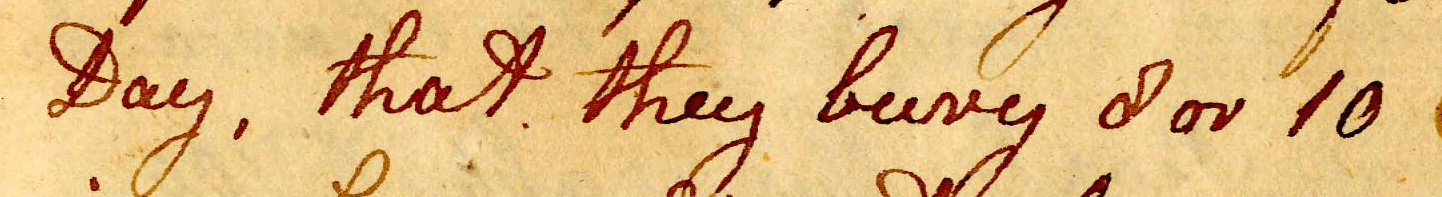Day, that they bury 8 or 10
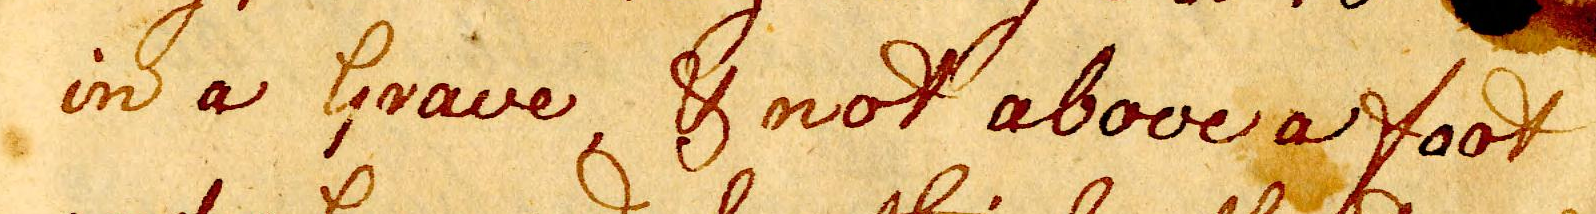in a Grave, & not above a foot
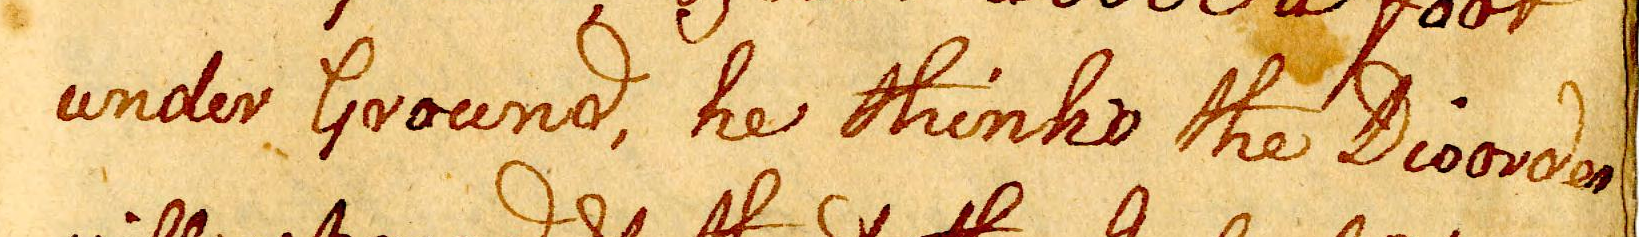under Ground, he thinks the Disorder
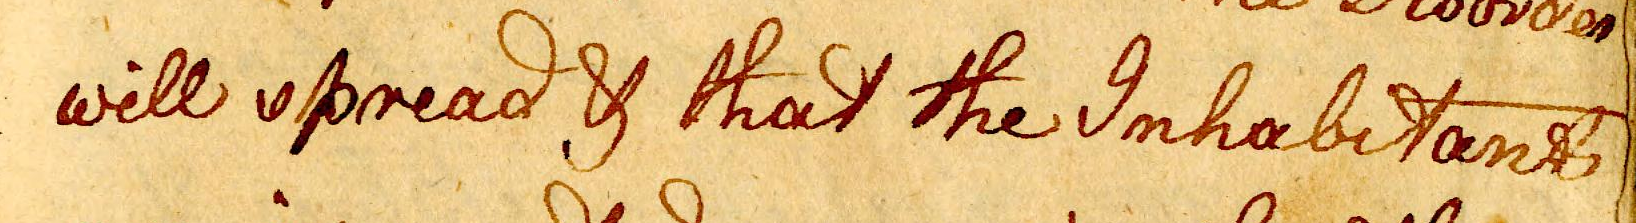will spread & that the Inhabitants
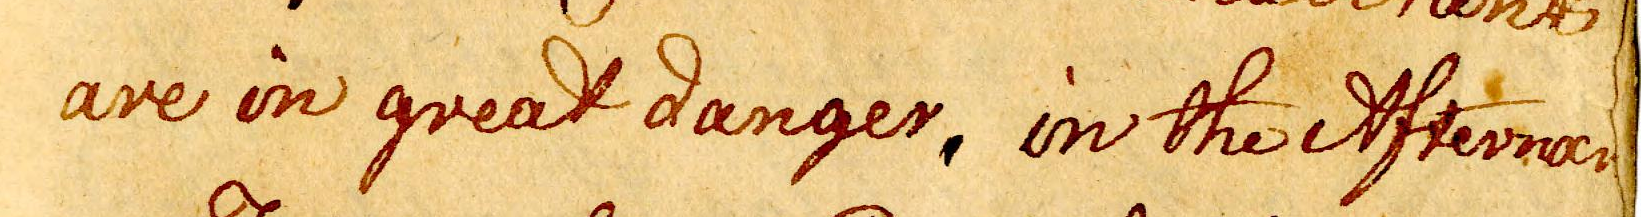are in great danger, in the Afternoon
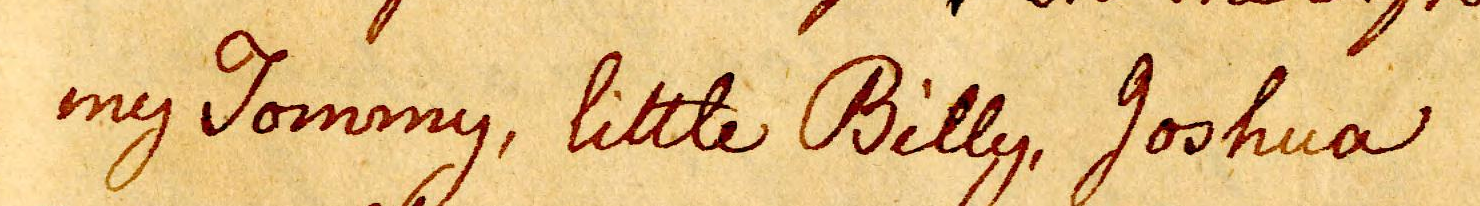my Tommy, little Billy, Joshua
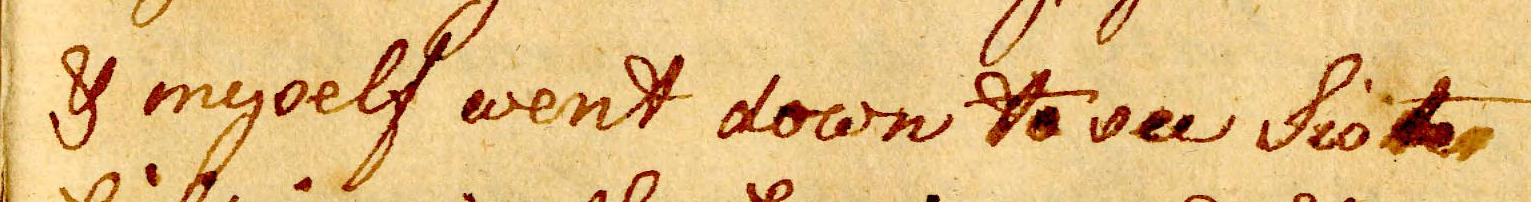& myself went down to see Sister
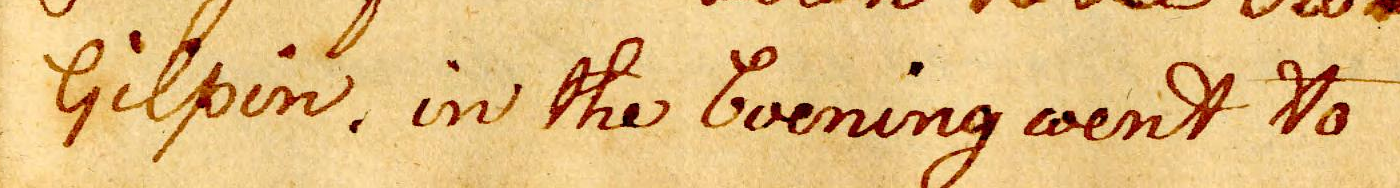Gilpin, in the Evening went to
